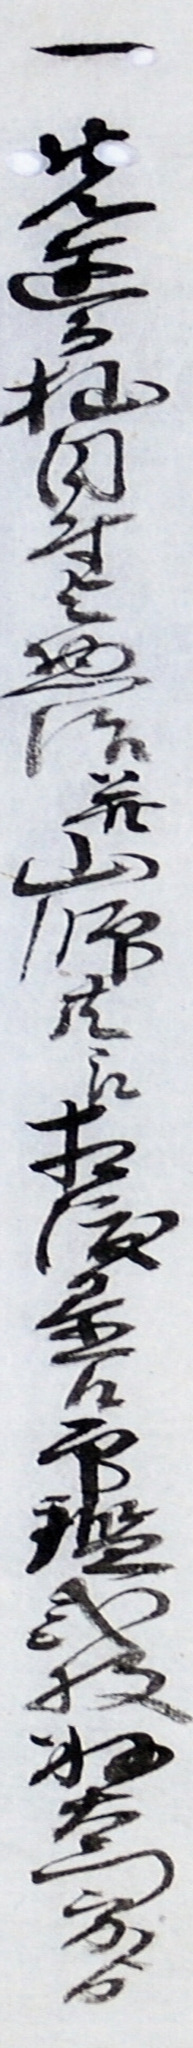一先達而掛目付之惣法幷山師共え相渡置候印鑑弐牧羽右衛門方ゟ
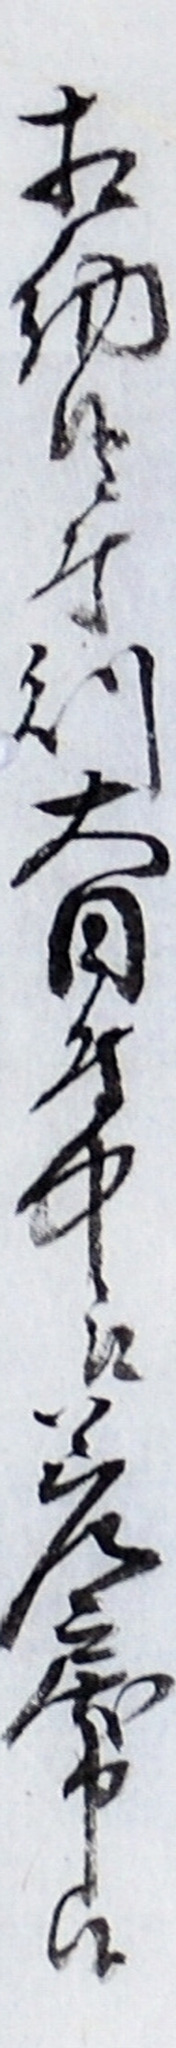相納候ニ付則大目付中え差戻申候
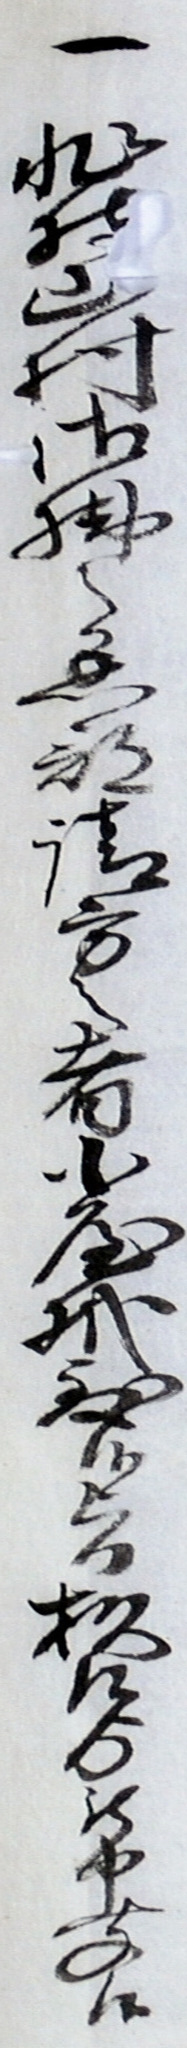一非村山村御払之丞部請方之者小屋掛知候旨杉戸杉左ゟ被申聞候
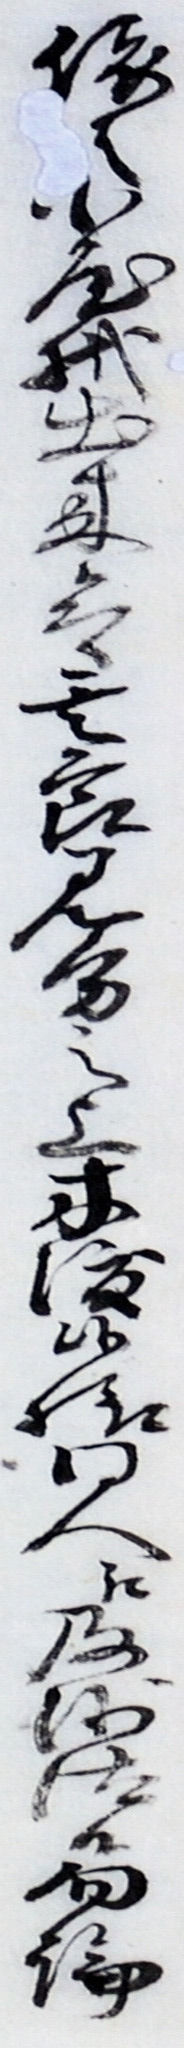依之小屋掛出来候はゝ其節見分之上木渡候様同人江及沙汰候勿論
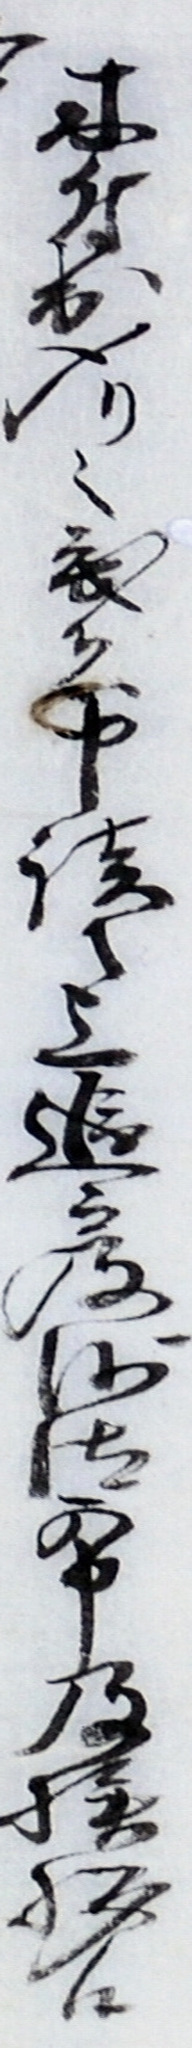木付出入り之義申談之上追而及沙汰不申及挨拶候
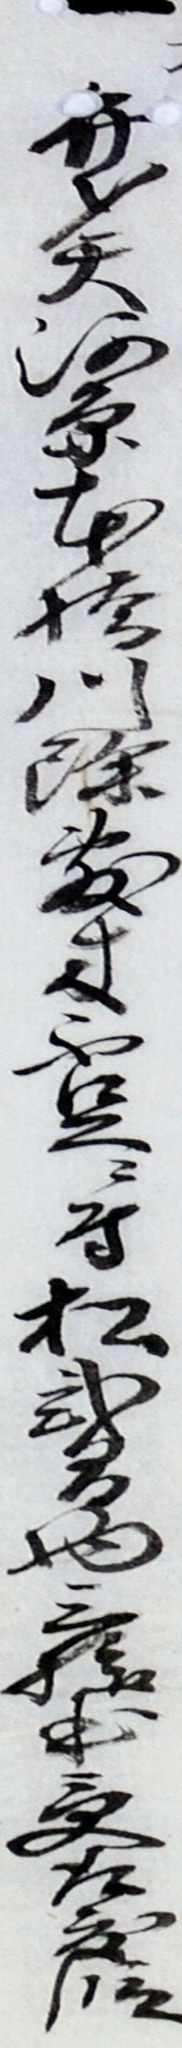一弁才天河原本橋川除敷木不足ニ付松弐間切三拾本受取度段
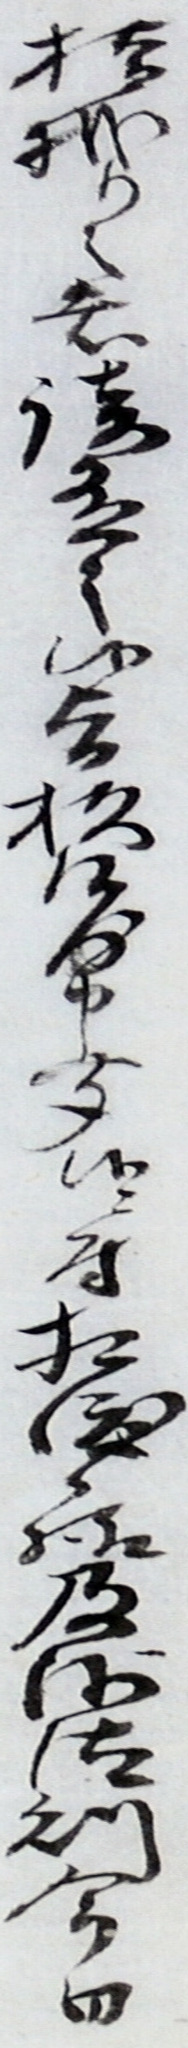持掛り之者談有之候旨杉左衛門申聞候ニ付相渡候様及沙汰則今日
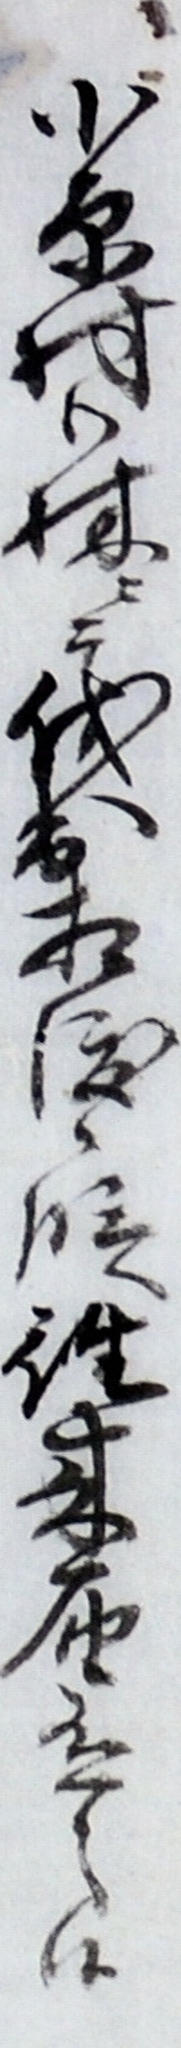小原村御林ニて伐出相渡候段往来届有之候
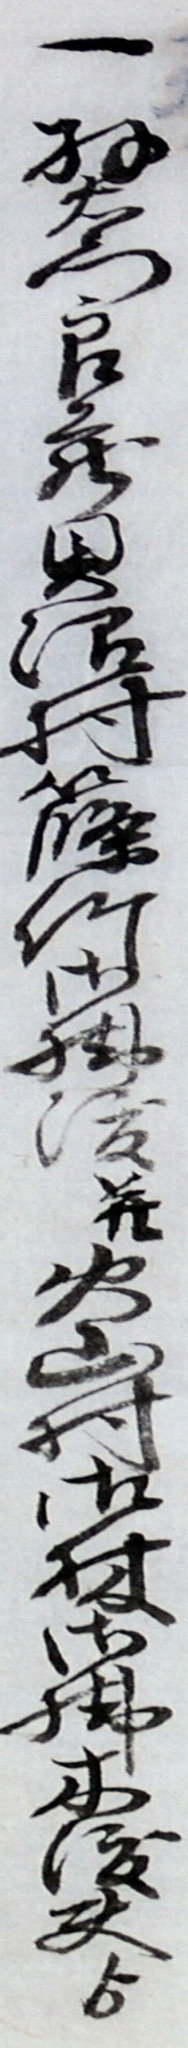一羽右衛門良蔵貝沼村篠竹御払渡并火山村御林御払木渡夫より
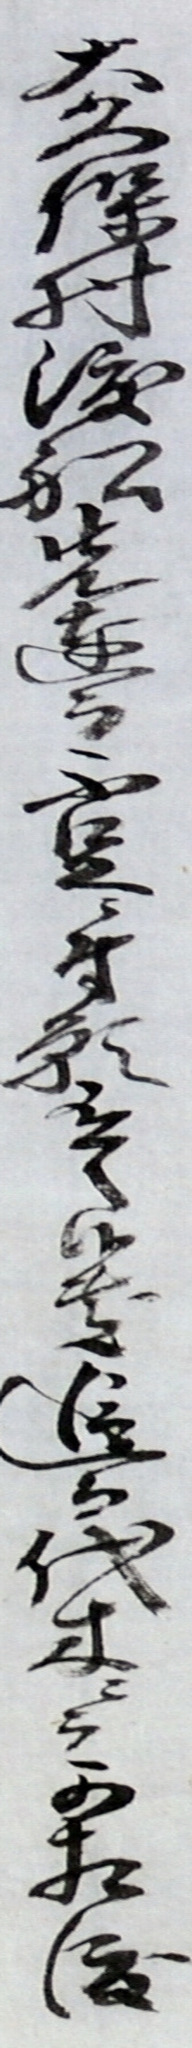大久保村渡船先達而不足ニ付願有之候処追而代木ニ而可相渡
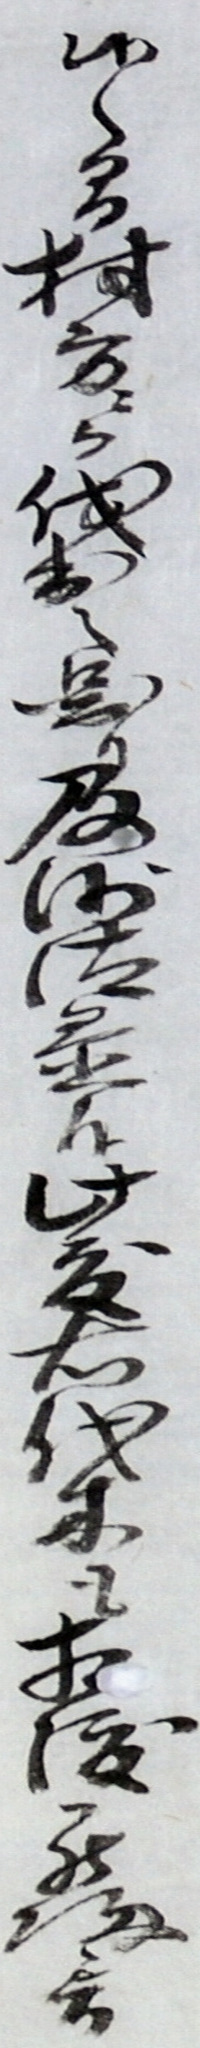候之間村方ニ而伐出之図り及沙汰置候此度右代木も相渡罷帰候旨
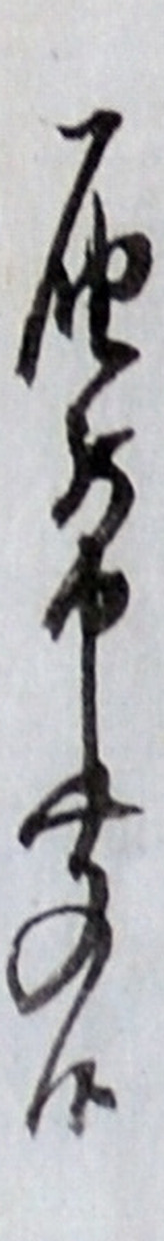届被申聞候
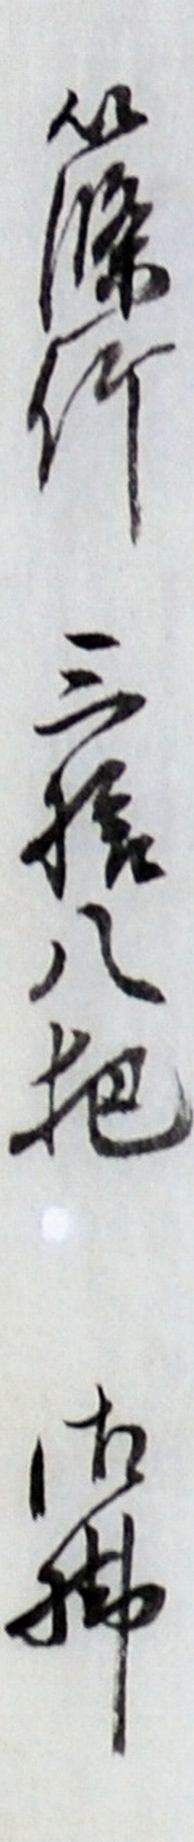篠竹三拾八把御払

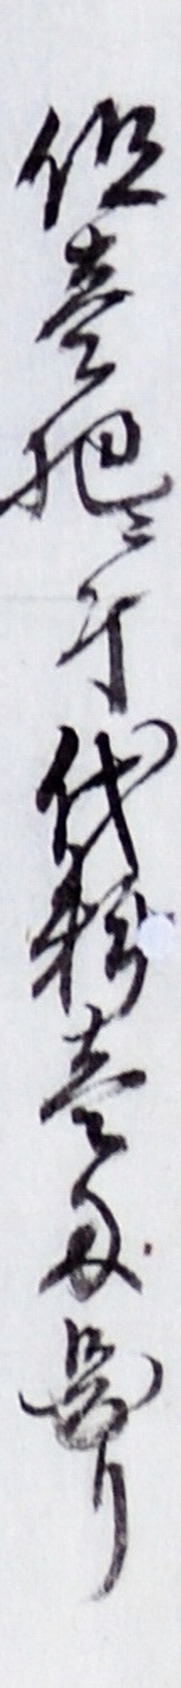但壱把ニ付代粉壱匁図り
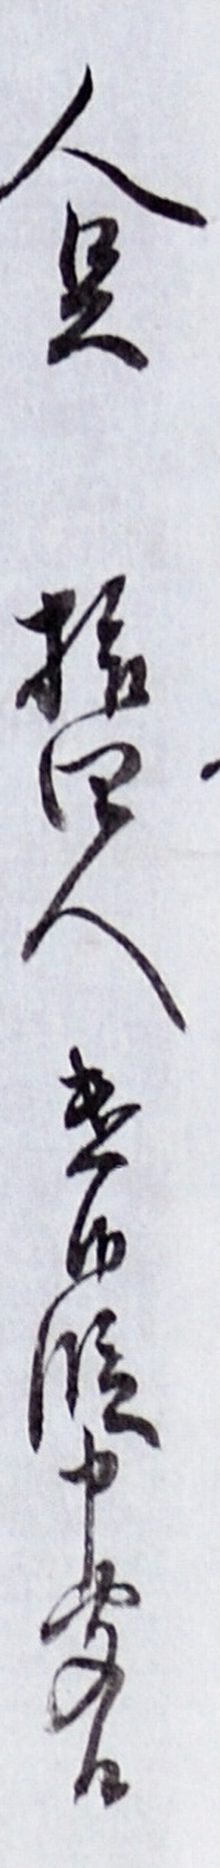人足拾四人遣候段申聞候
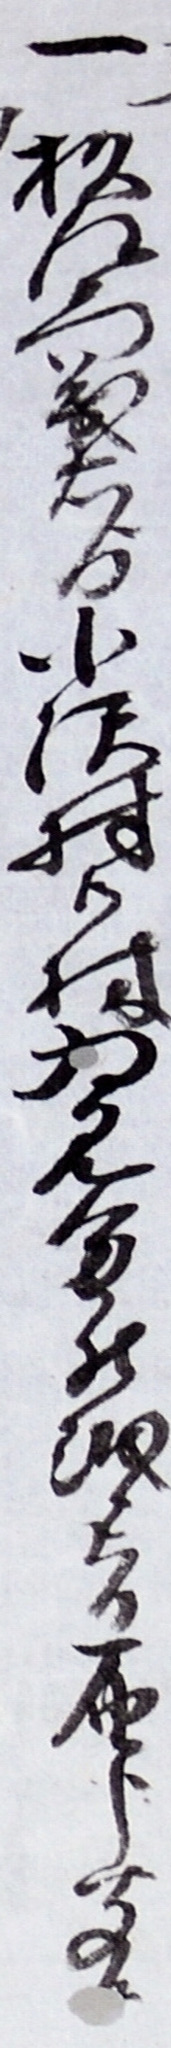一杉左衛門義右衛小沢村御林為見分罷越候旨届申聞候
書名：御山奉行御用控
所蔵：伊那市立高遠町図書館・合同会社AMANE
